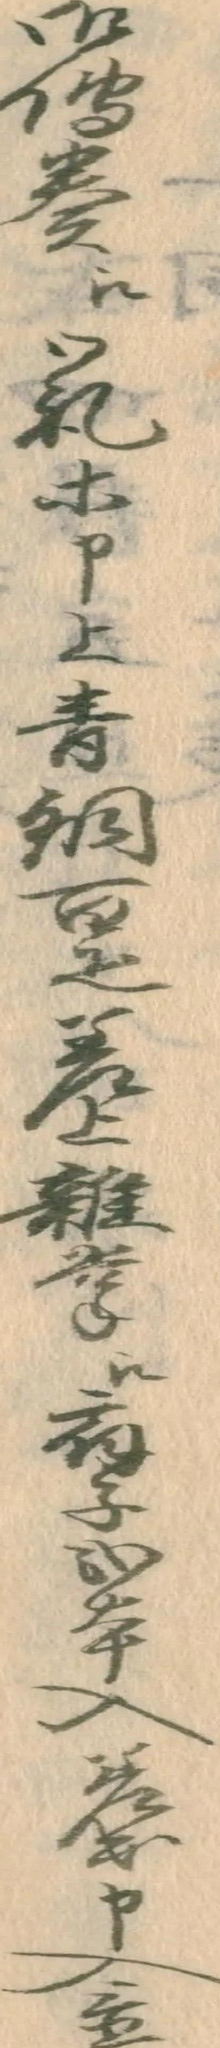御伝奏江御礼等申上青銅百疋差上雑掌江扇子弐本入差出申入置
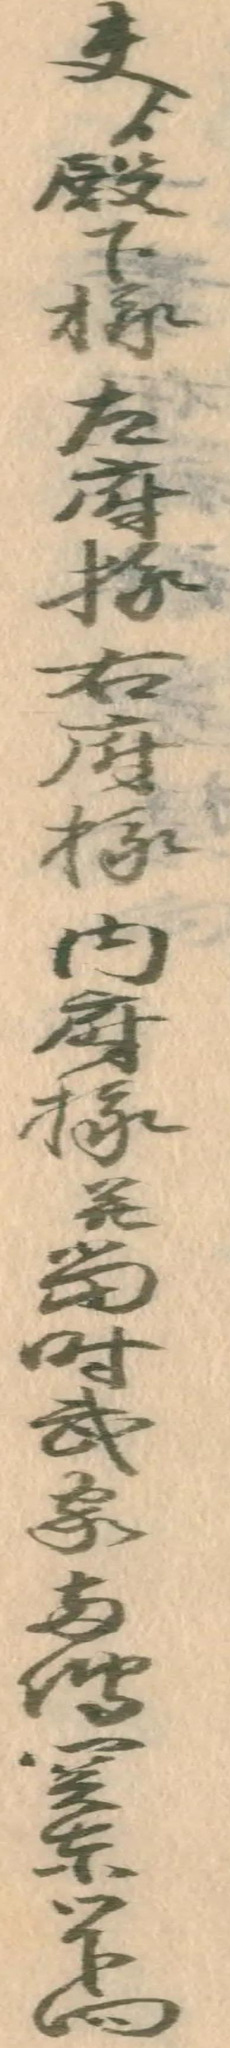夫ゟ殿下掾左府掾右府掾内府掾并当時武家両伝関東御下向
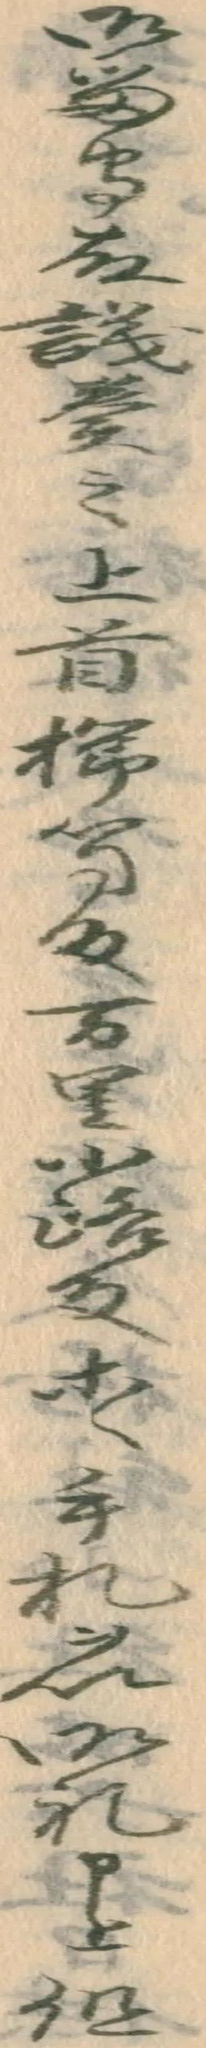御留守故議奏之上首櫛笥殿万里小路殿等へ手札ヲ以御礼申上但
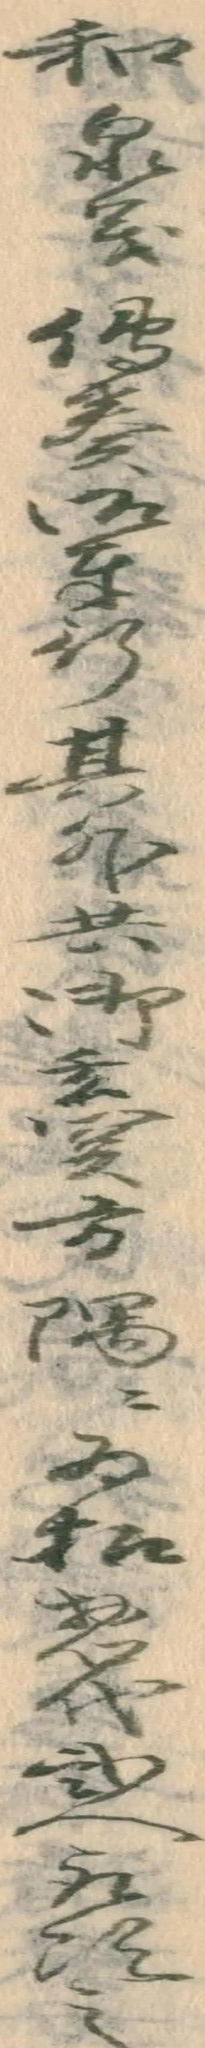和泉義伝奏御奉行其外共御玄関方隅ニ為招惣代弐人取次之
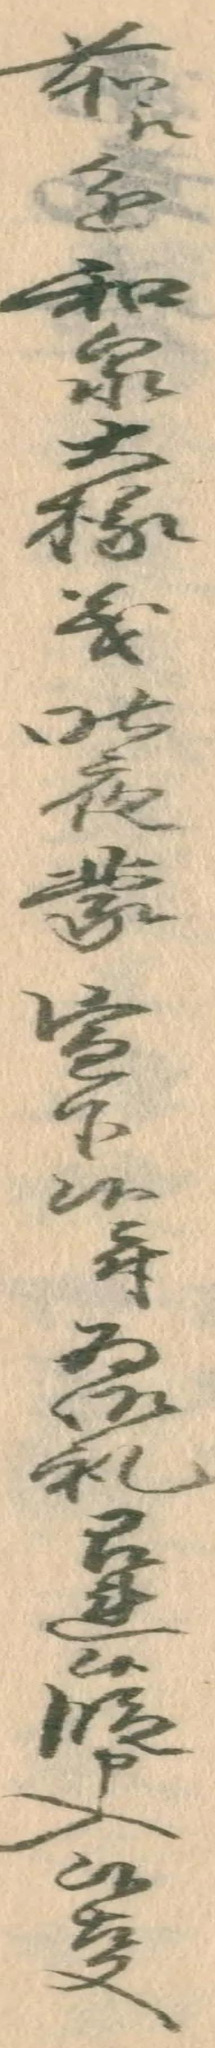前江進和泉大掾義昨夜蒙宣下候ニ付為御礼召連候段申入候事
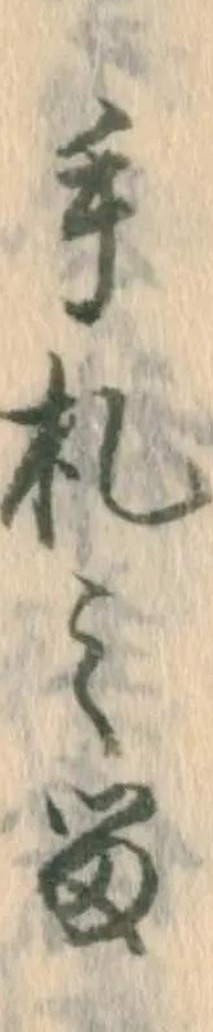手札之留
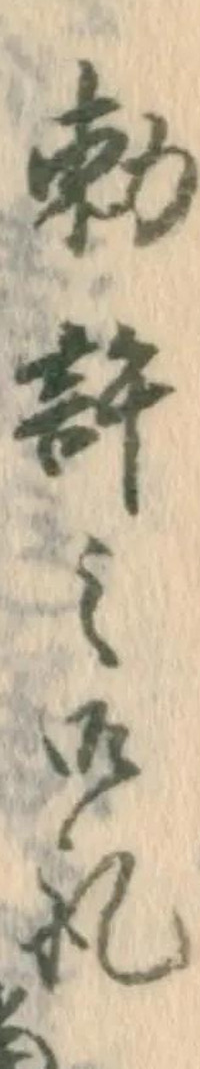勅許之御礼
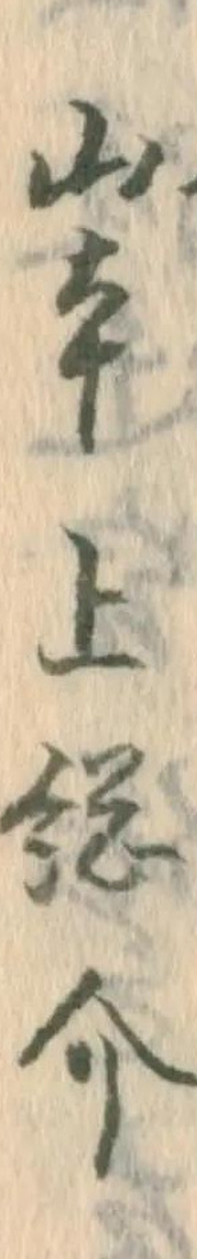山本上総介
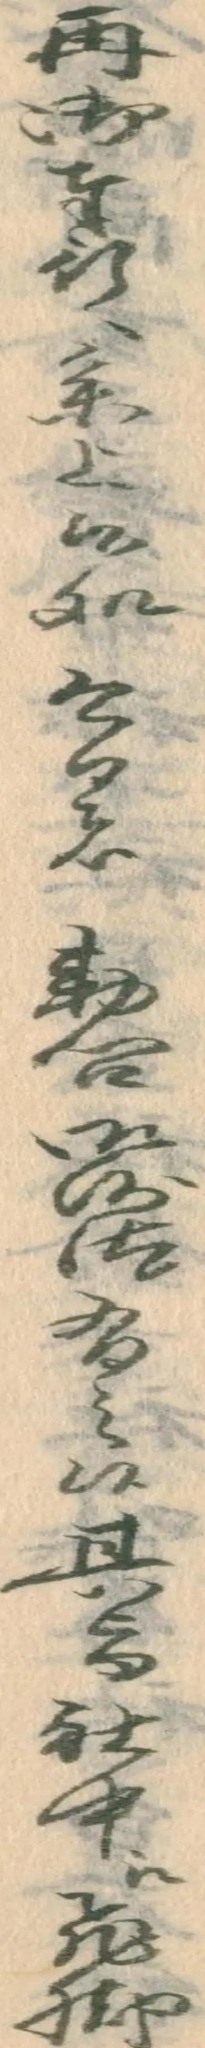再御奉行へ参上候処今日は勅問御沙汰有之候其旨社中江飛脚
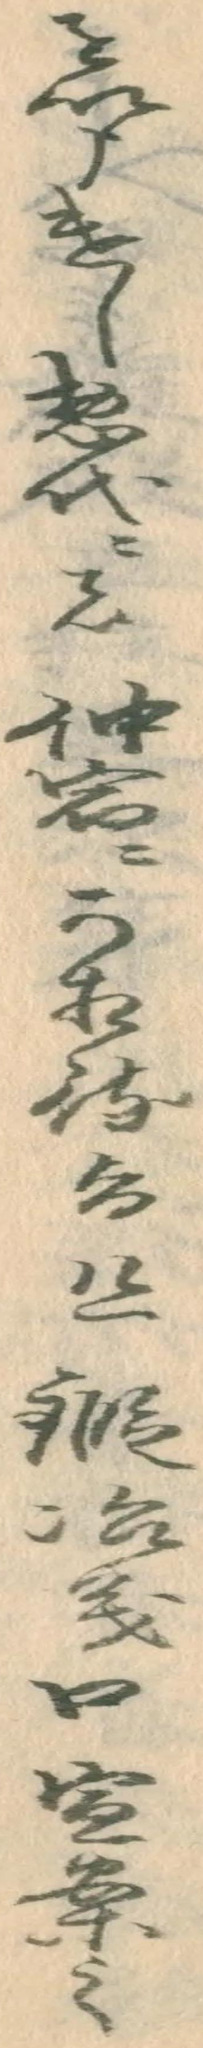を以申遣し惣代ニは仲宿ニ可相待旨且鍛冶義口宣案之
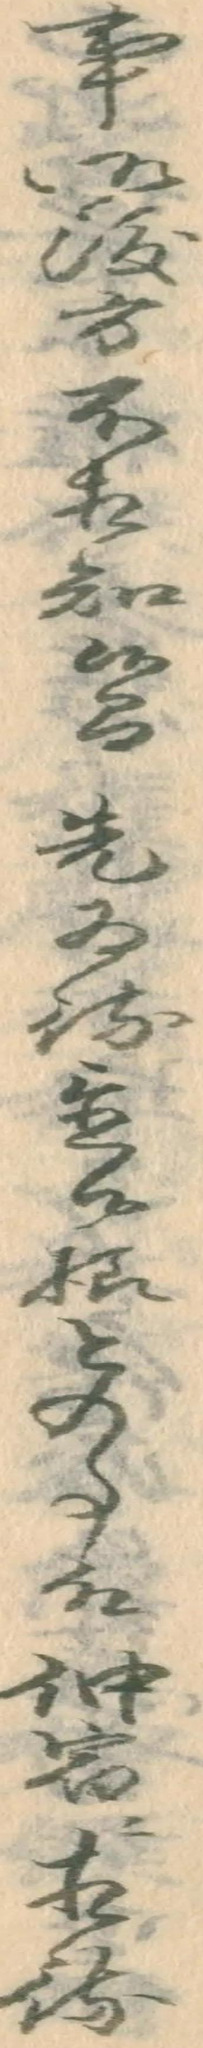事御渡方不相知候間先為待置候様との事故仲宿ニ相待
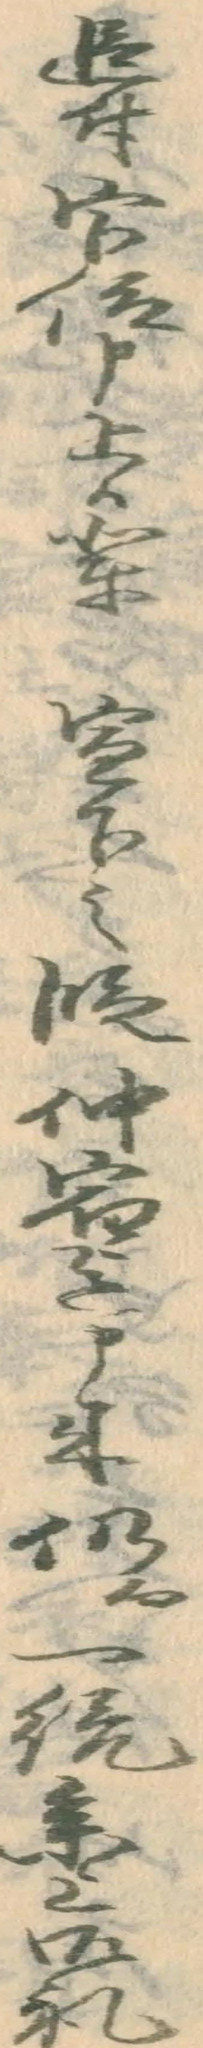追付官位申上候輩宣下之段仲宿迄申来仍而一統参上御礼
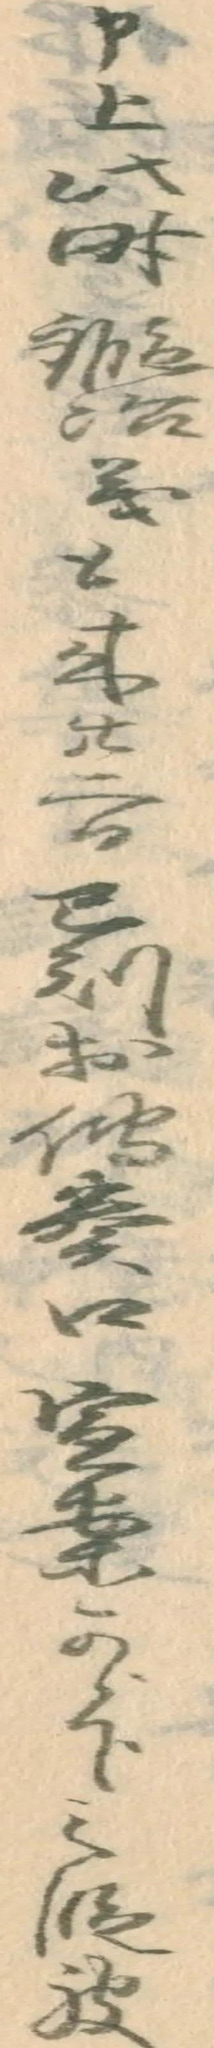申上此時鍛冶義も来廿二日巳刻於伝奏口宣案可被下之段被

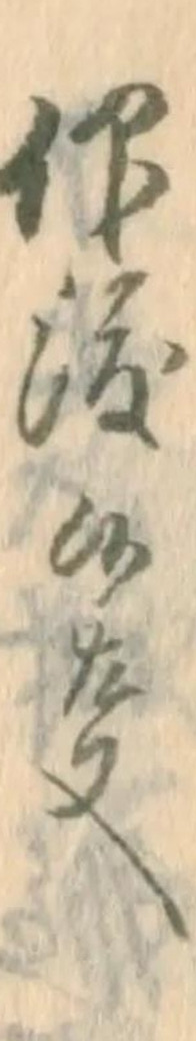仰渡候事
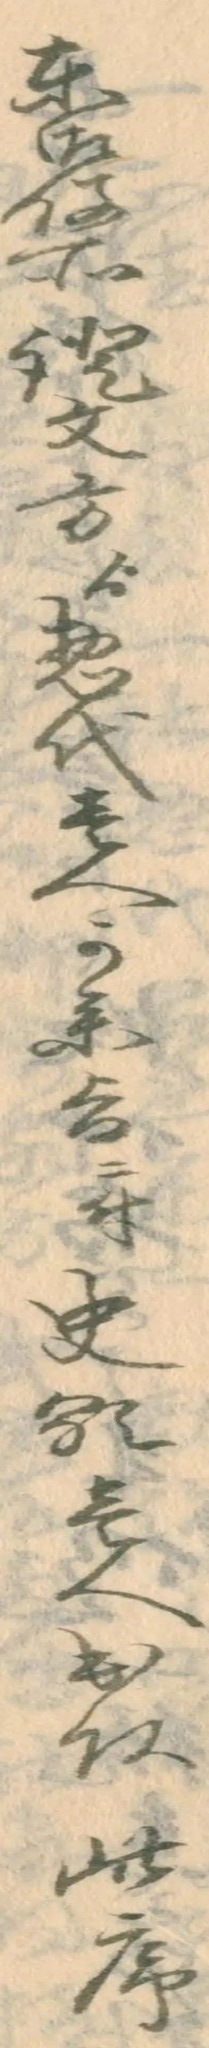一東御役所証文方ゟ惣代壱人可参旨ニ付史顕壱人出頭此序
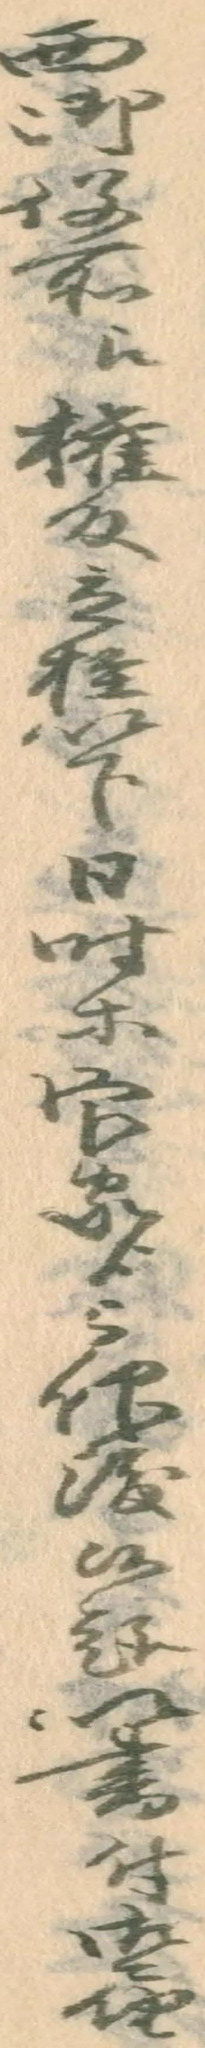西御役所江権殿立柱以下日時等官家ゟ被仰渡候趣以書付御届
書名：賀茂社記録. 第17冊
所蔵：国立国会図書館 National Diet Library, JAPAN
